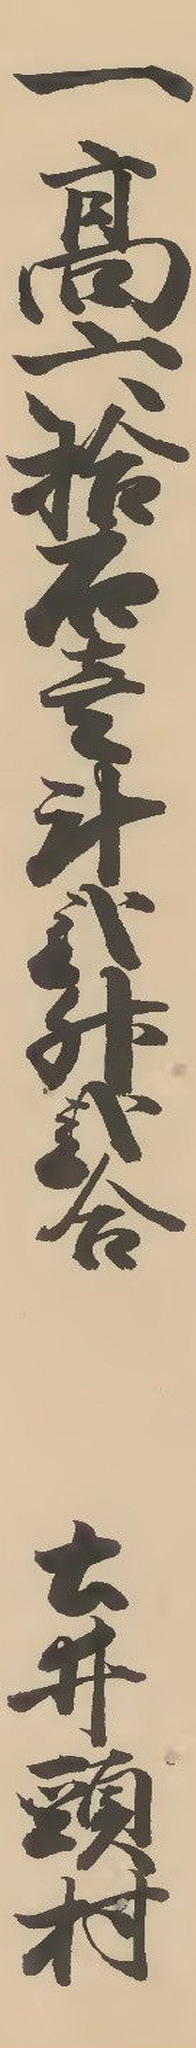一髙六拾石壱斗弐升弐合土井頭村
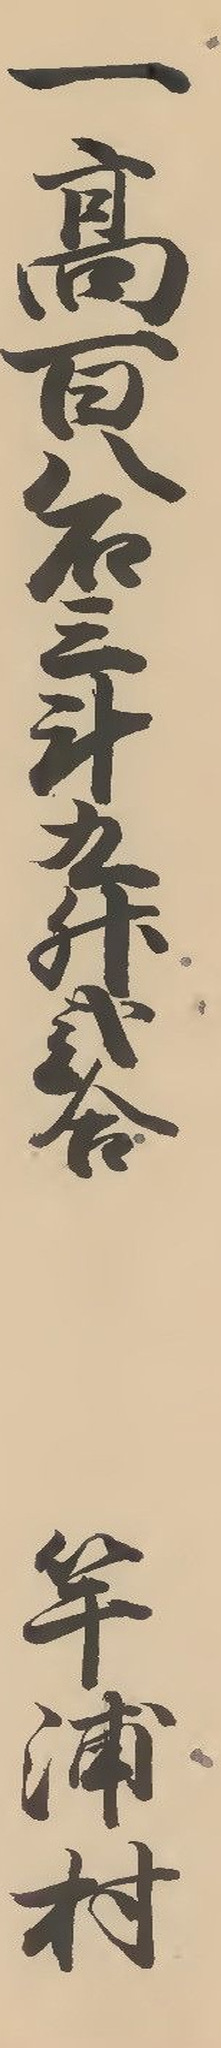一髙百八石三斗九升弐合竿浦村
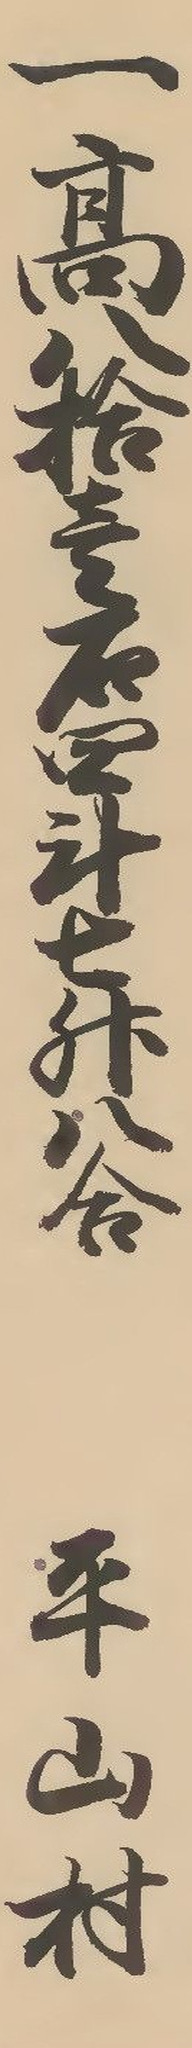一髙八拾壱石四斗七升八合平山村

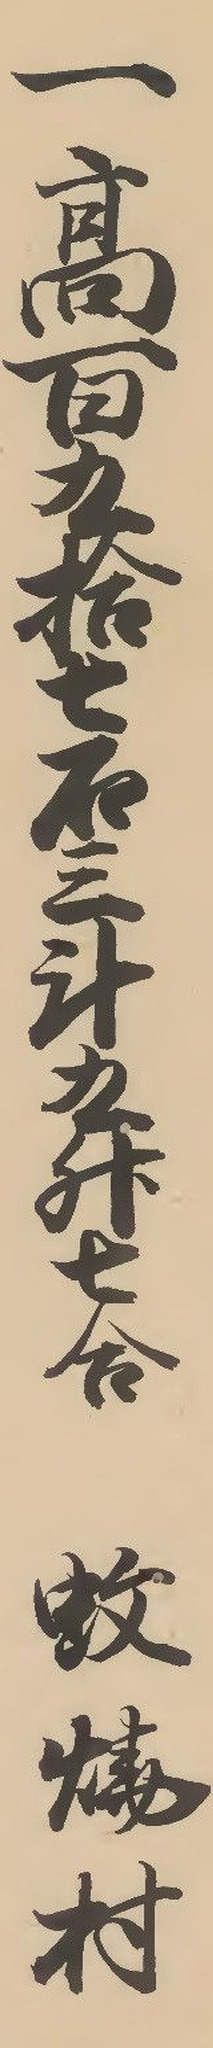一髙百九拾七石三斗九升七合蚊焼村
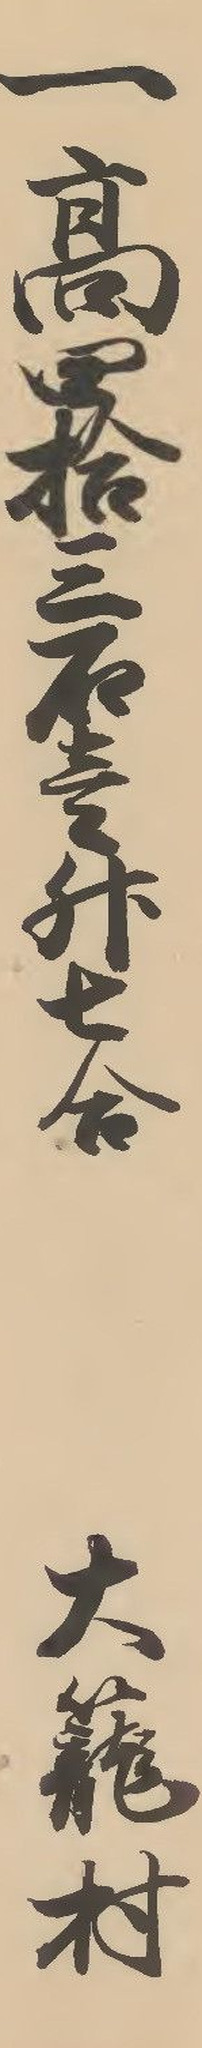一髙四拾三石壱升七合大籠村
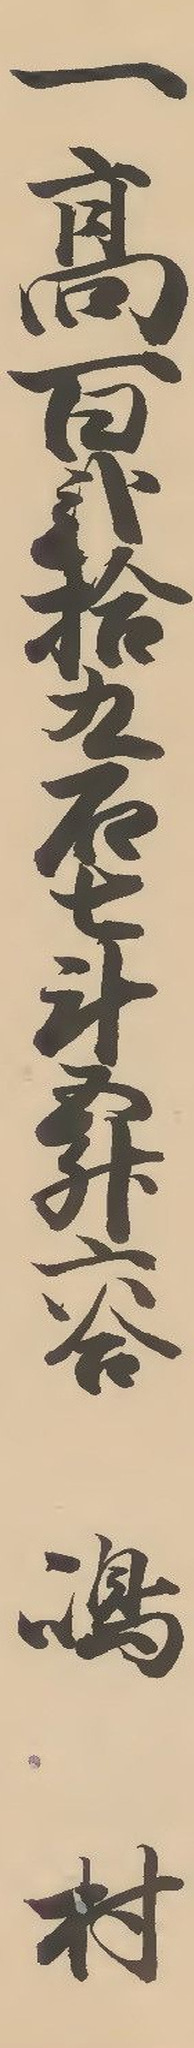一髙百弐拾九石七斗五升六合嶋村
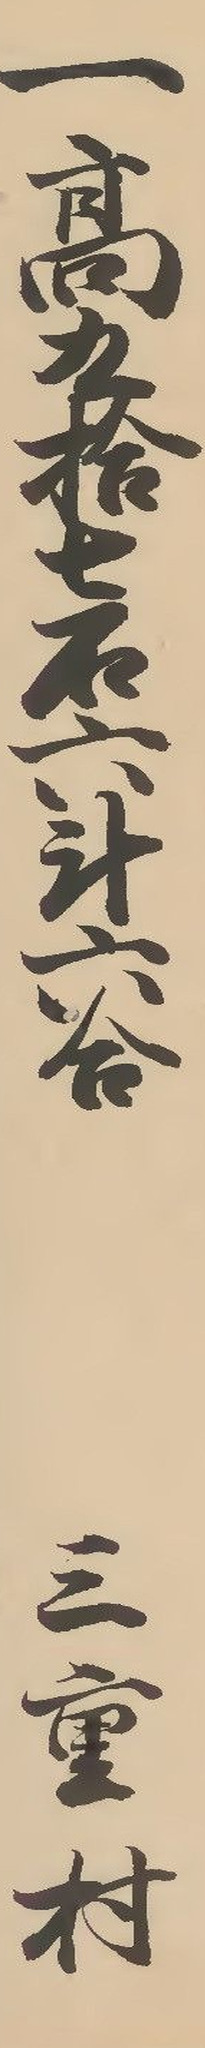一髙九拾七石六斗六合三重村
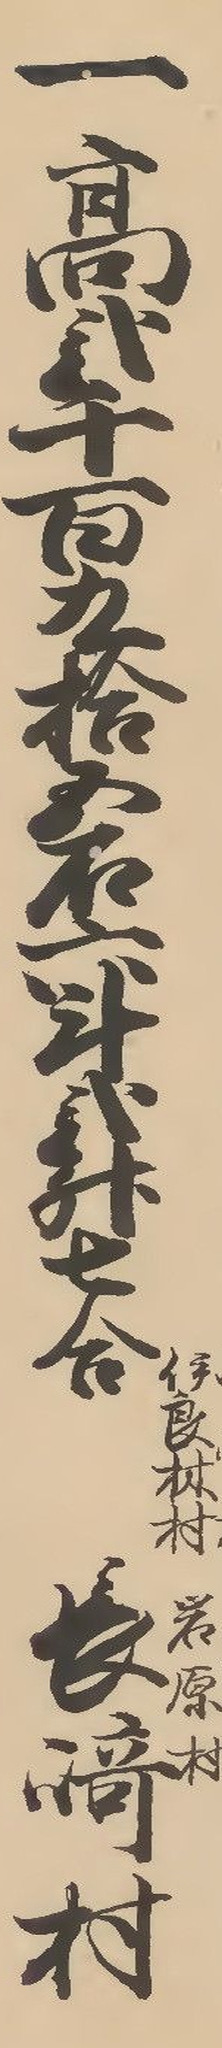一髙弐千百九拾五石六斗弐升七合長崎村
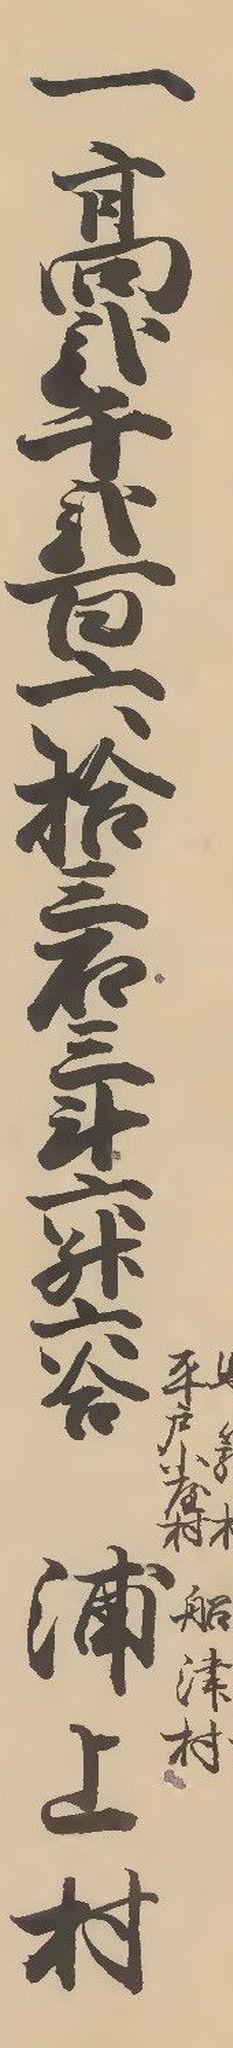一髙弐千弐百六拾三石三斗六升六合浦上村
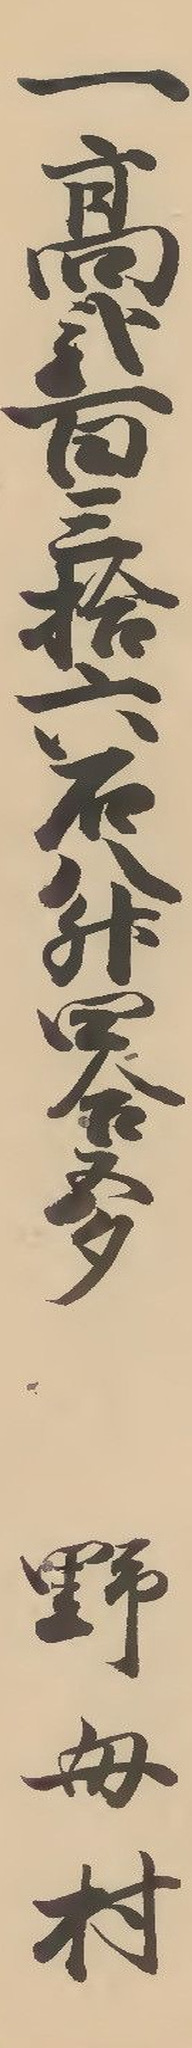一髙弐百三拾六石八升四合五夕野母村

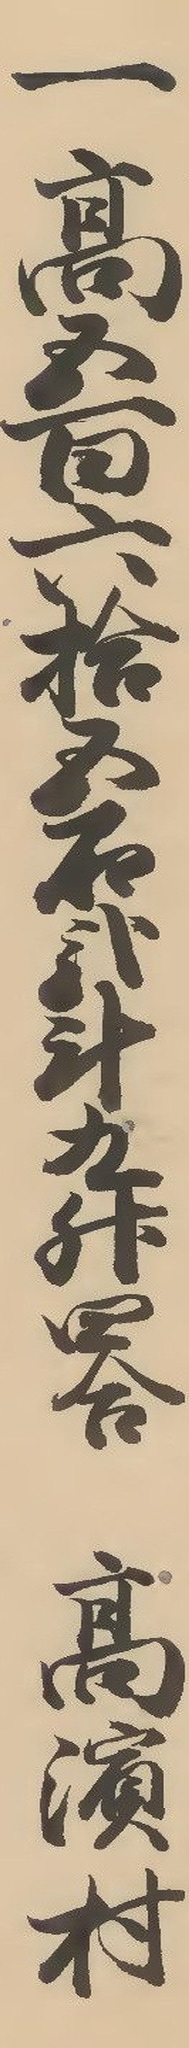一髙五百六拾五石弐斗九升四合高濱村
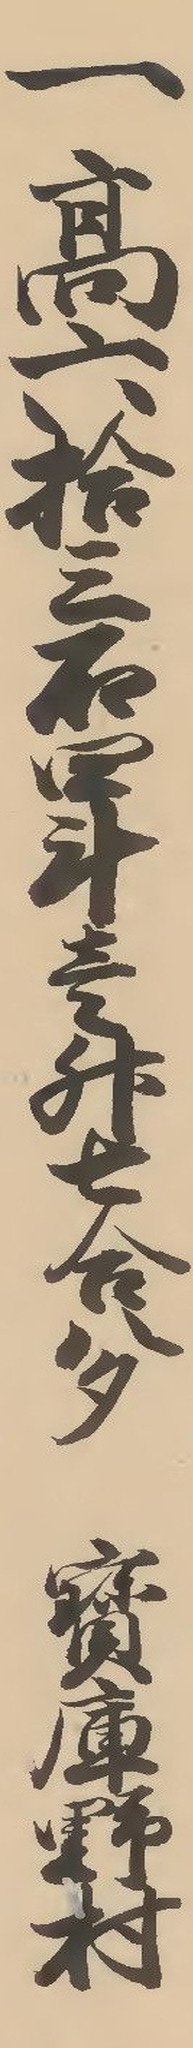一髙六拾三石四斗壱升七合八夕寶庫野村
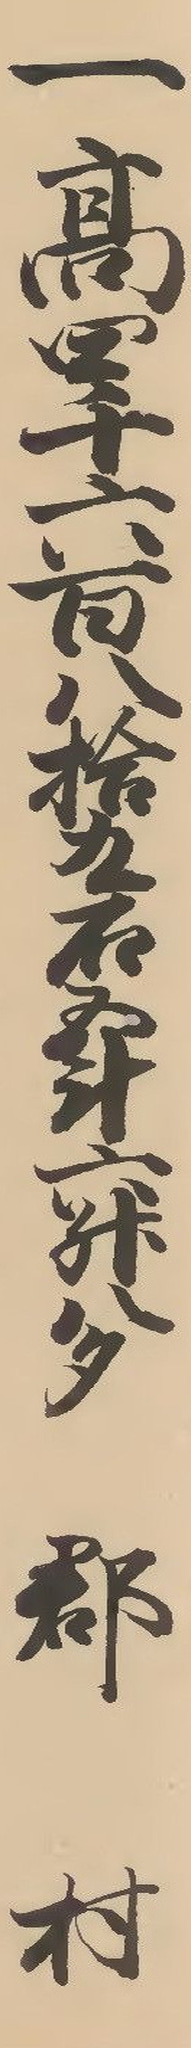一髙四千六百八拾九石五斗六升八夕郡村
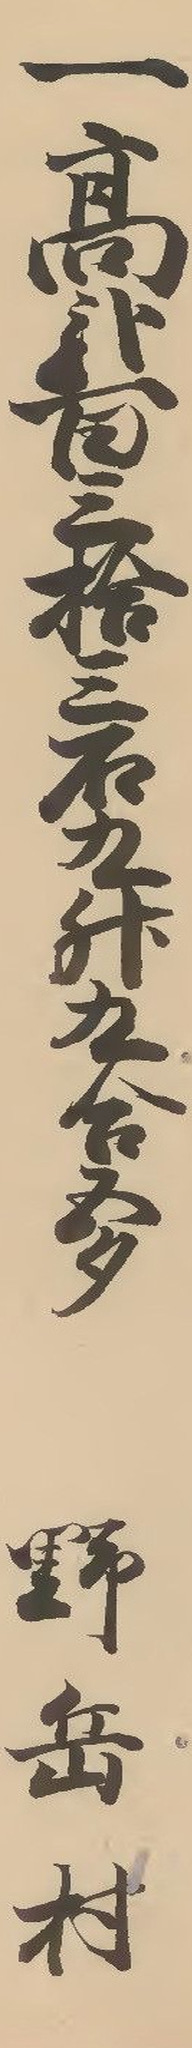一髙弐百三拾三石九升九合五夕野岳村
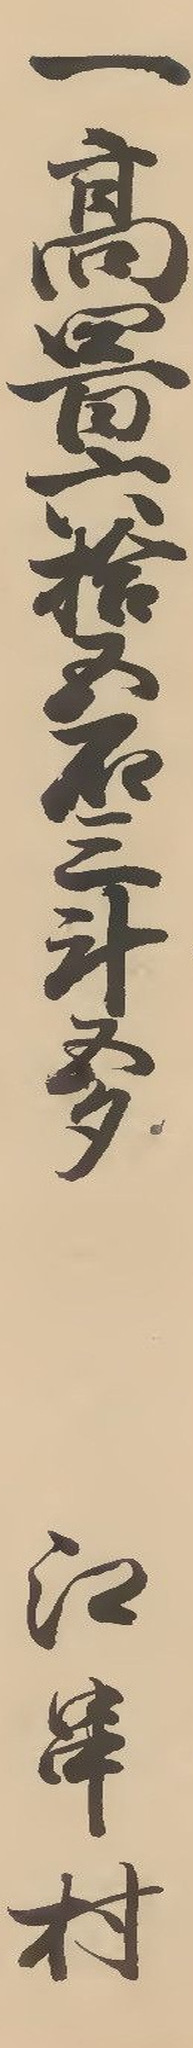一髙四百六拾五石三斗五夕江串村
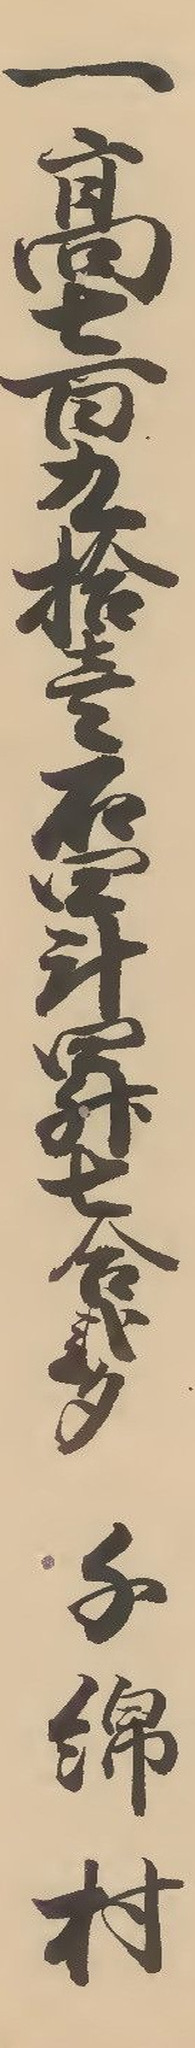一髙七百九拾壱石四斗四升七合弐夕千綿村
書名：肥前国郷帳
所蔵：国立公文書館 National Archives of Japan
